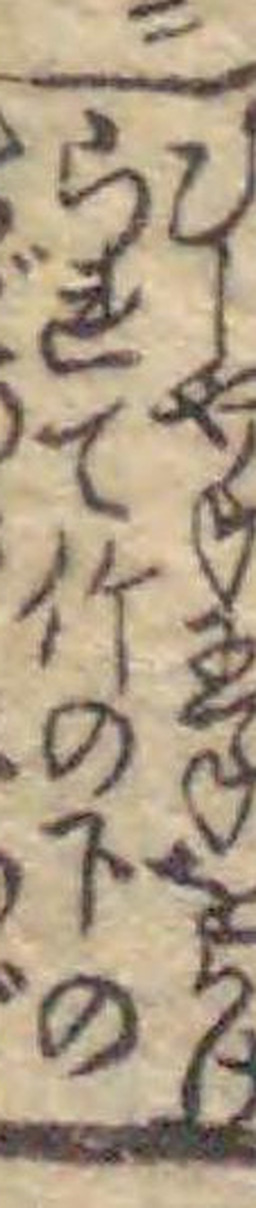られて竹の下の
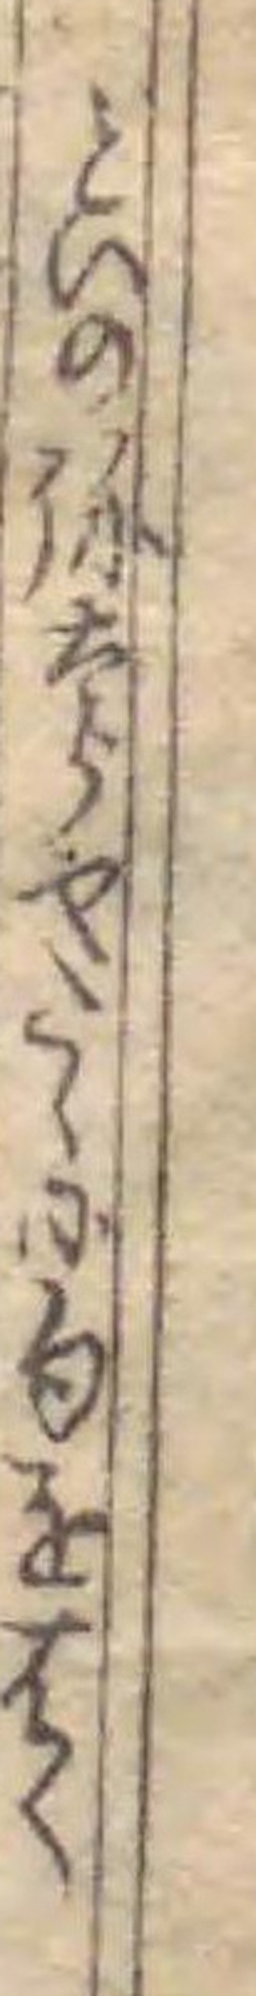といの弥太郎やたらに？句をはく
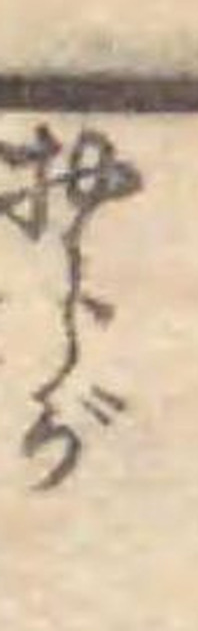おらが
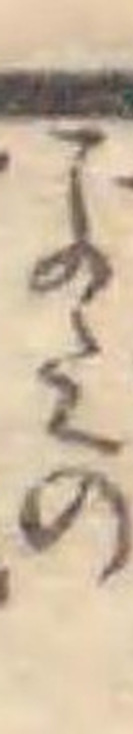よみの
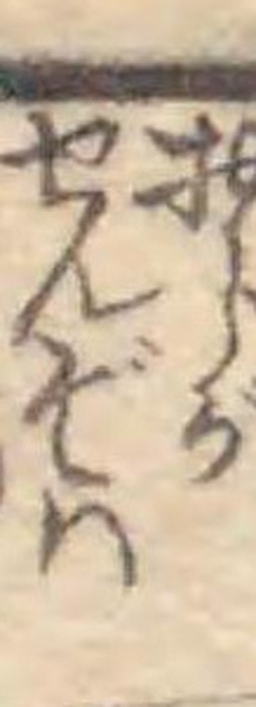せんぞは
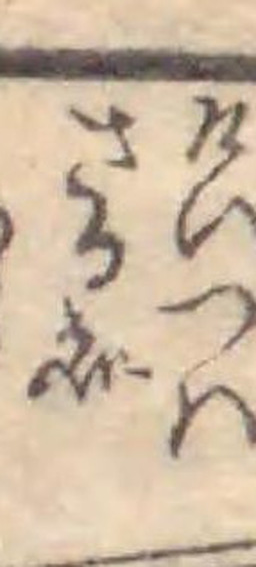さる処
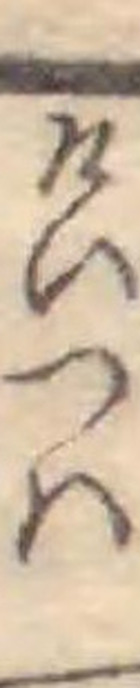けいづは
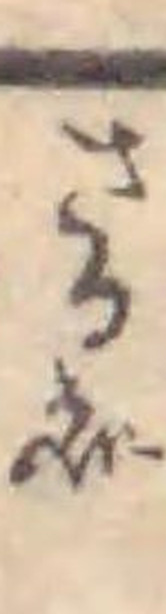さる処

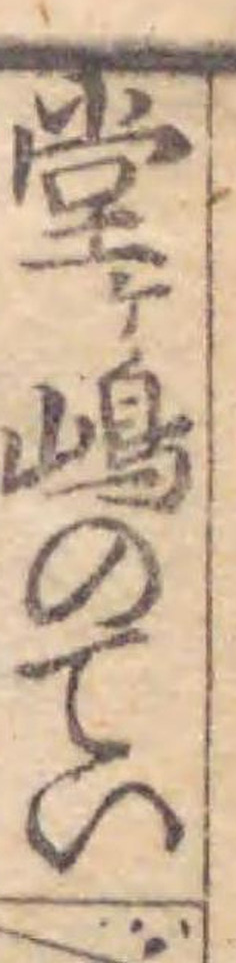堂ヶ島のてい
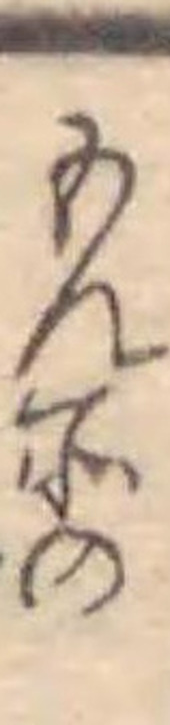もん所の
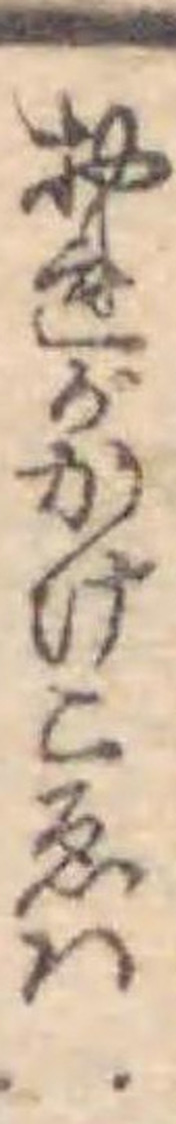おれがかけこゑは
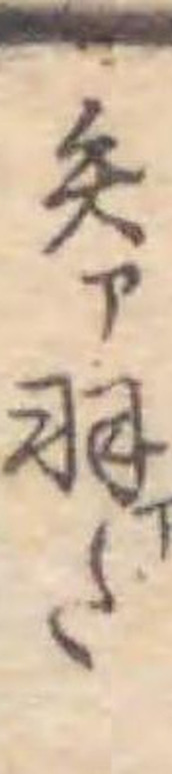矢ァ羽ァた
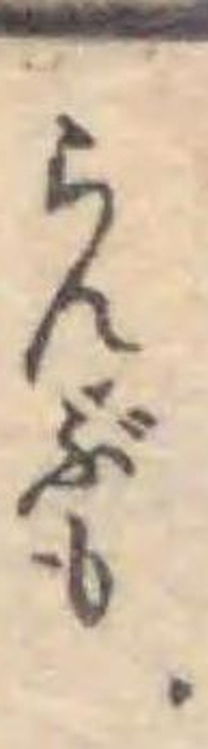らんぶも
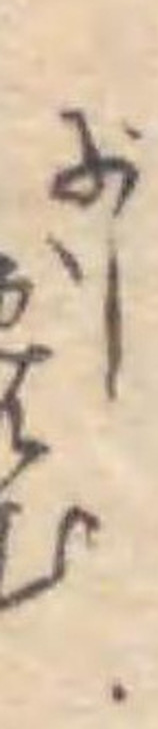おはむ
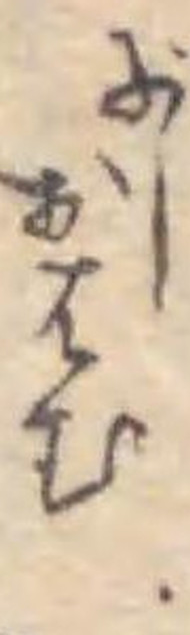おはむ
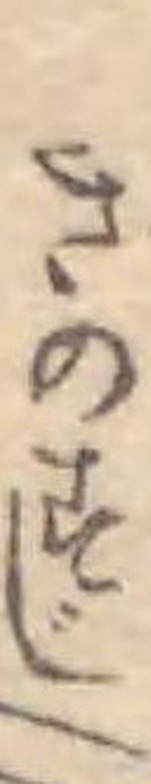きのすじ
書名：文武二道万石通 : 3巻
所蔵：国立国会図書館 National Diet Library, JAPAN
